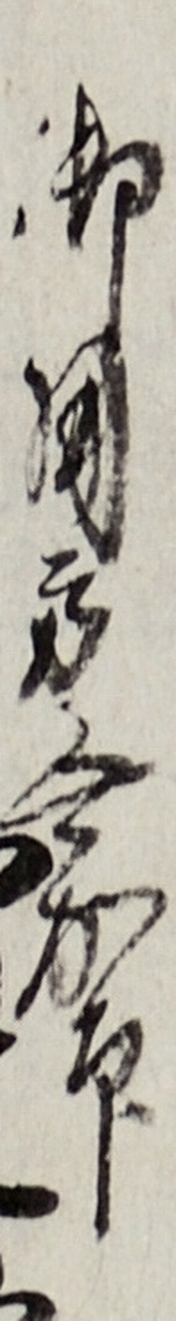御用方無加印
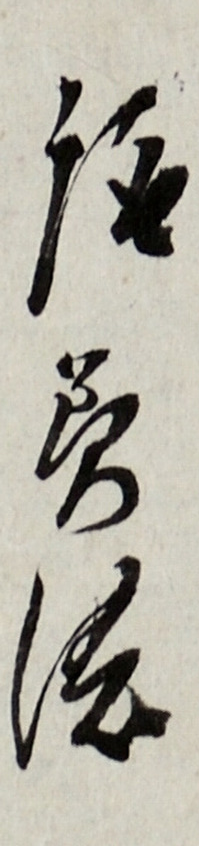諏美濃
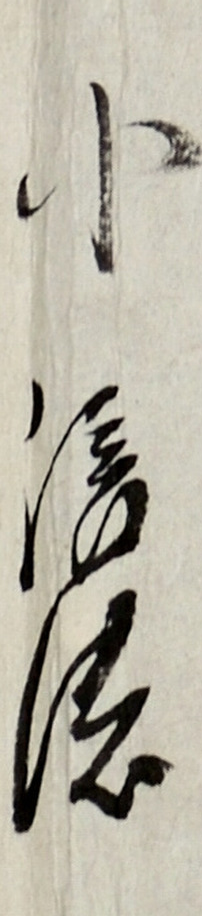小信濃
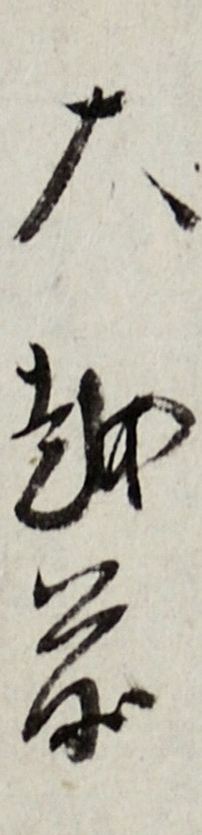大越前
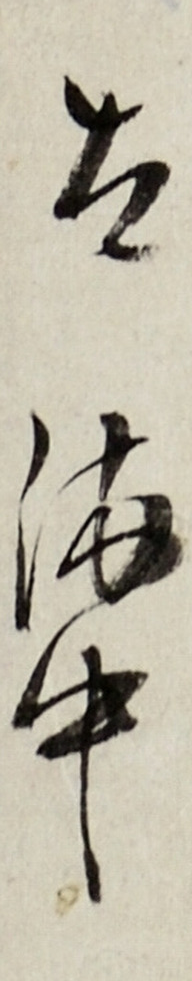太備中
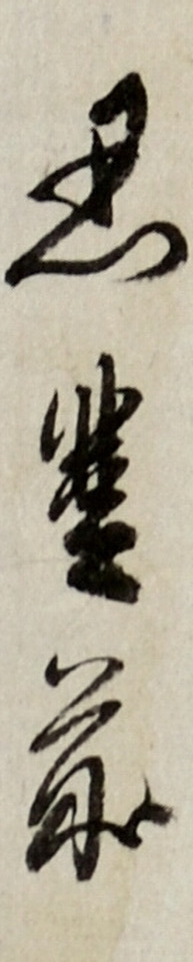黒豊前

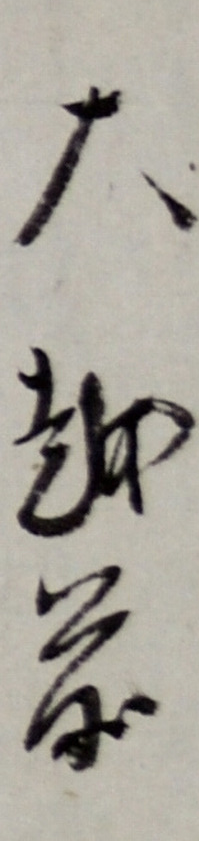大越前
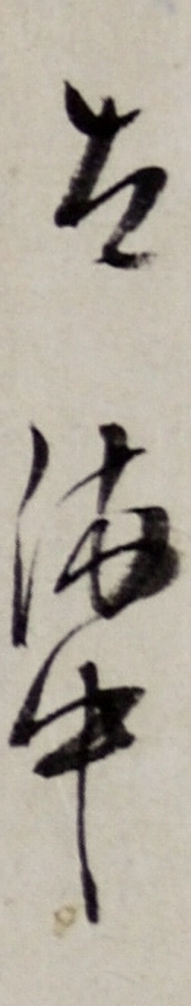太備中
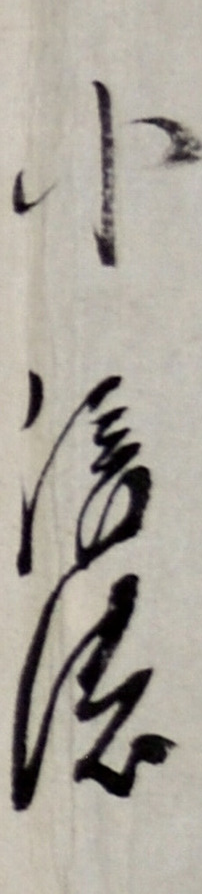小信濃
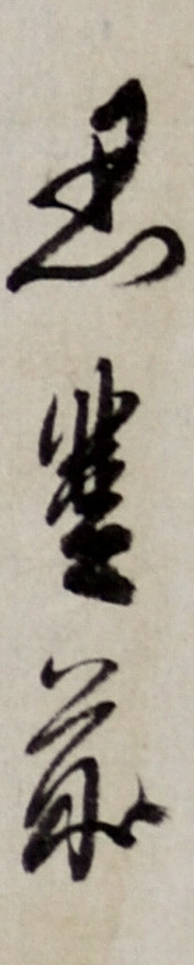忍豊前
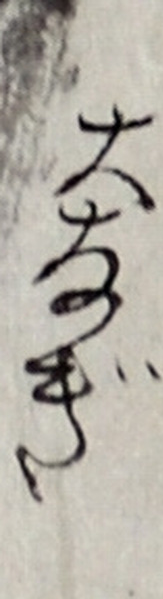大なぎ
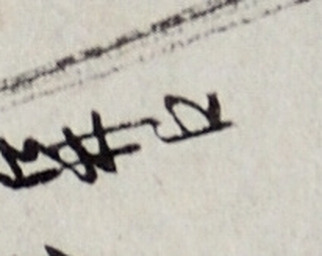古井口
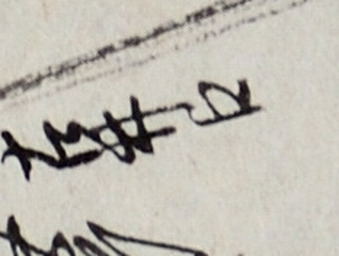古井口
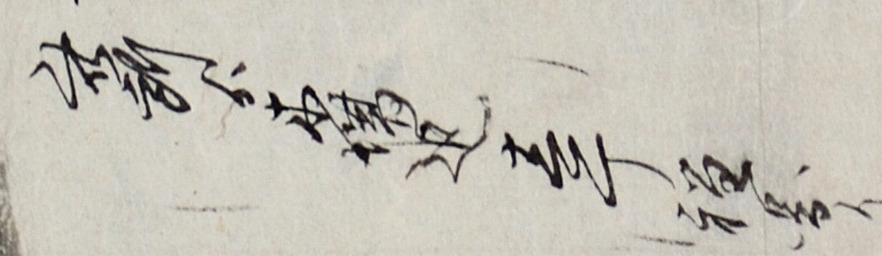此所ゟ木場迄壱丁程図り
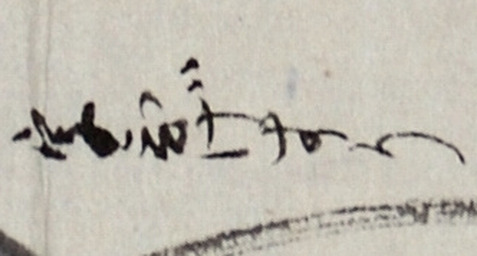字ひげすり
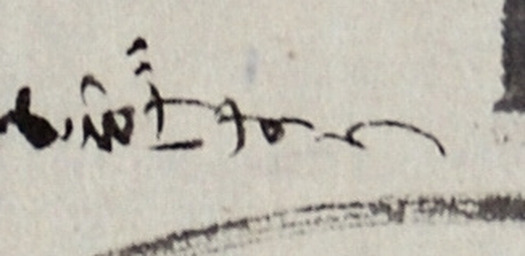字ひげすり
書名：赤穂宮田山論裁許状
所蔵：伊那市立高遠町図書館・合同会社AMANE
